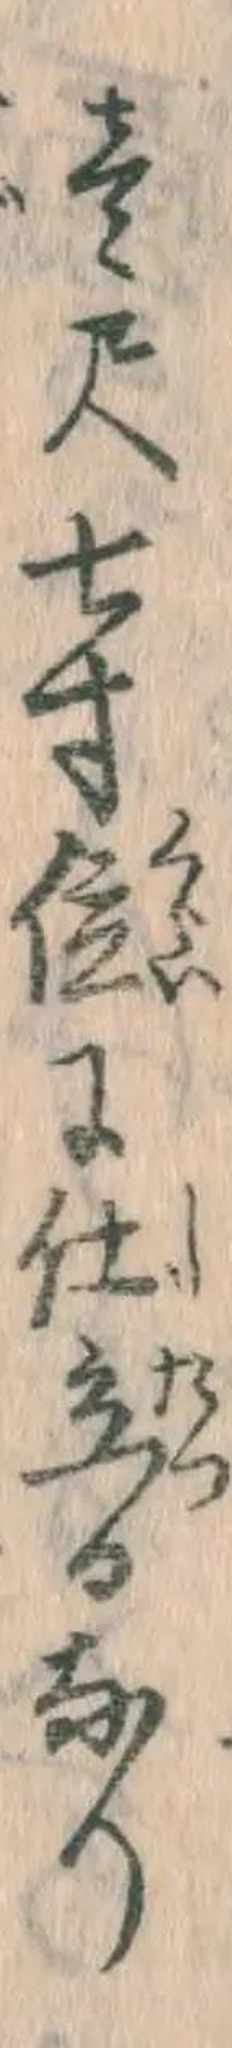壱尺七寸位に仕立るなり
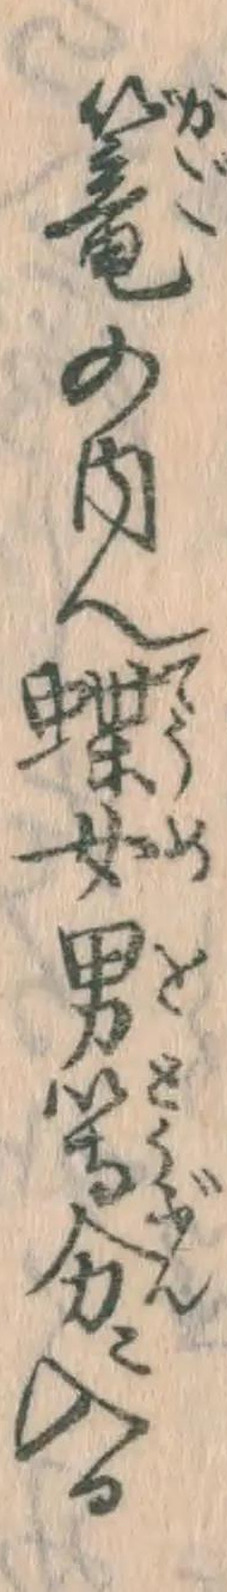篭の内へ蝶女男等分に入る
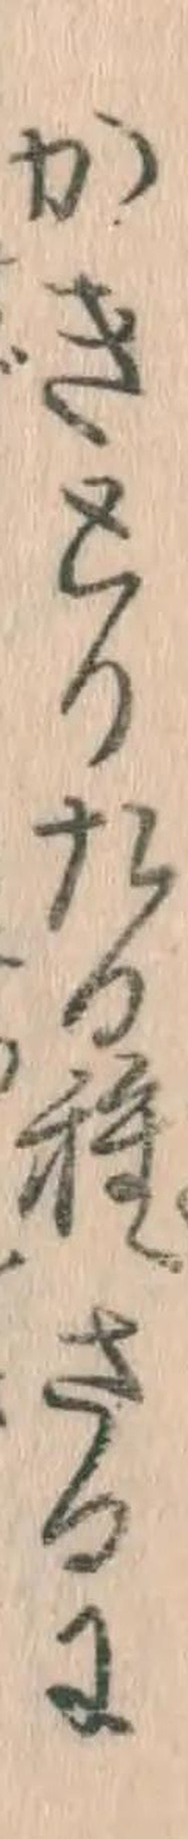かきとりたる種さるに
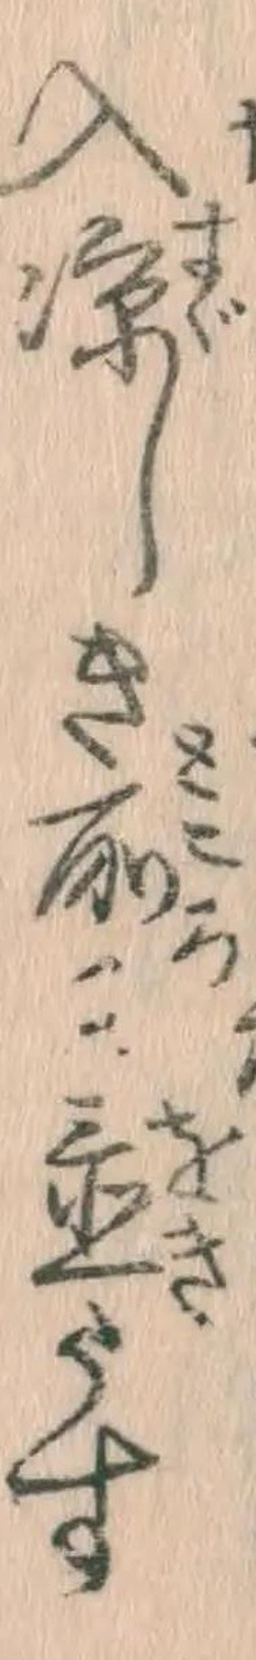入涼しき所に置うす
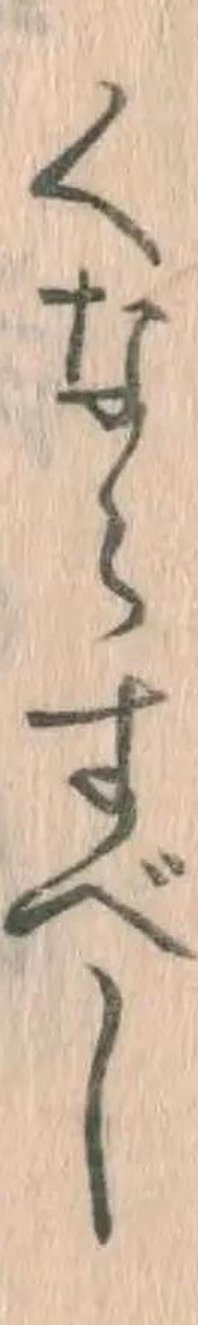くならすべし
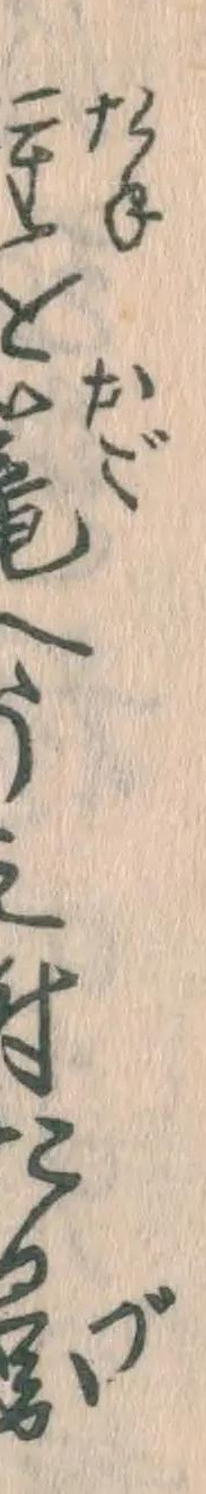種を篭へうみ付たる図
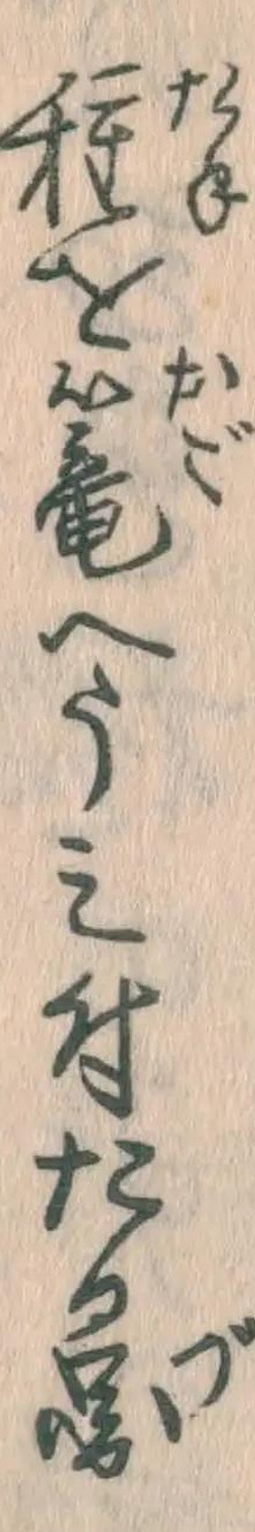種を篭へうみ付たる図
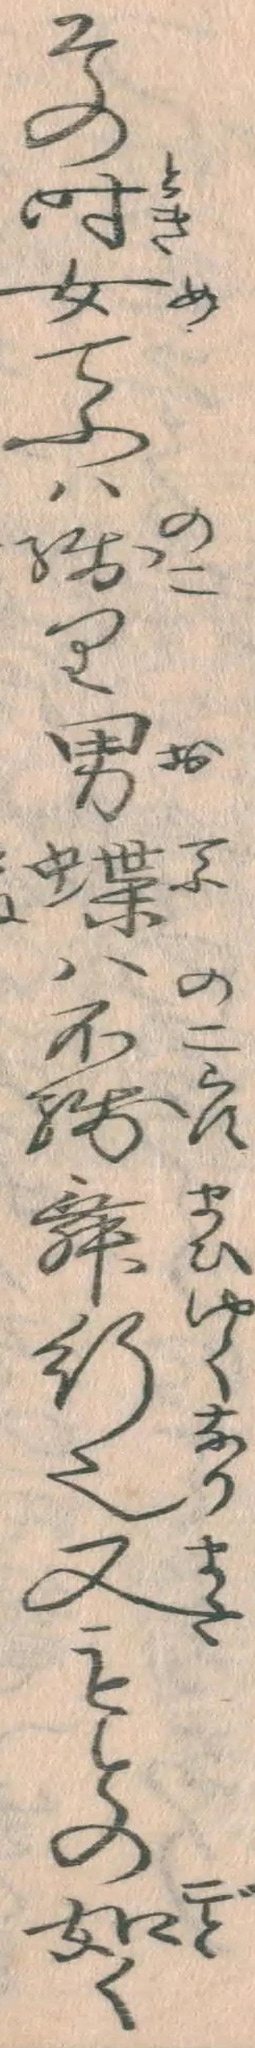その時女てふは残り男蝶は不残舞行也又もとの如く
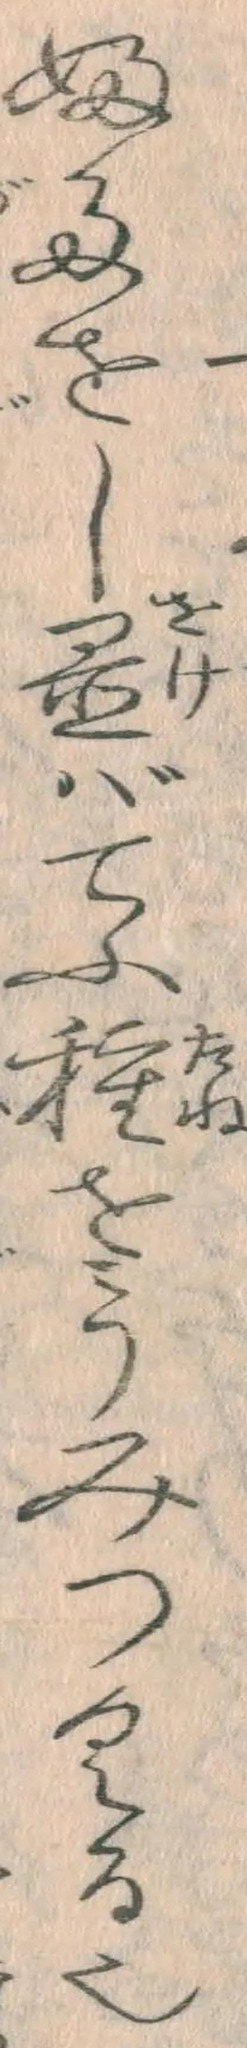ふたをし置ばてふ種をうみつくる也
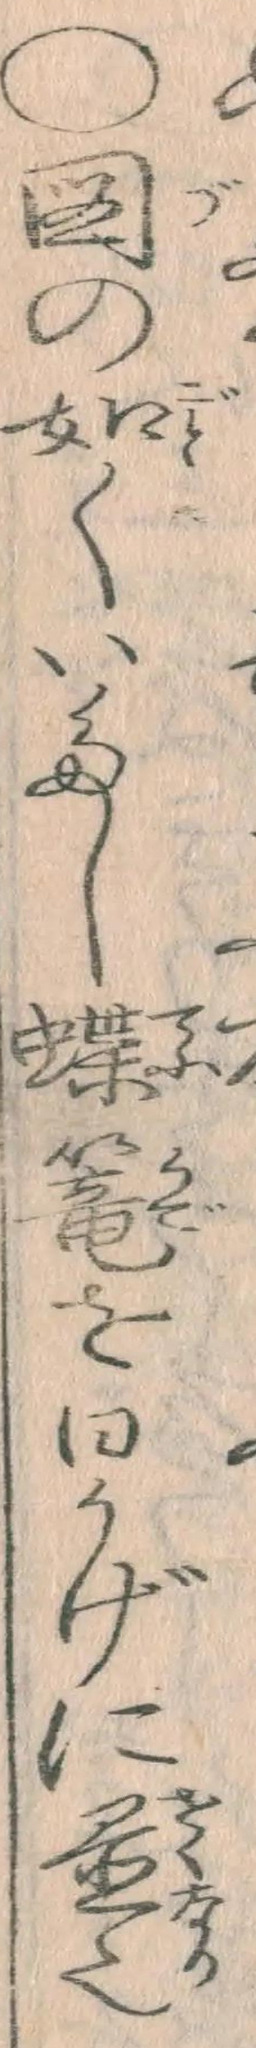○図の如くいたし蝶篭を日かげに置也

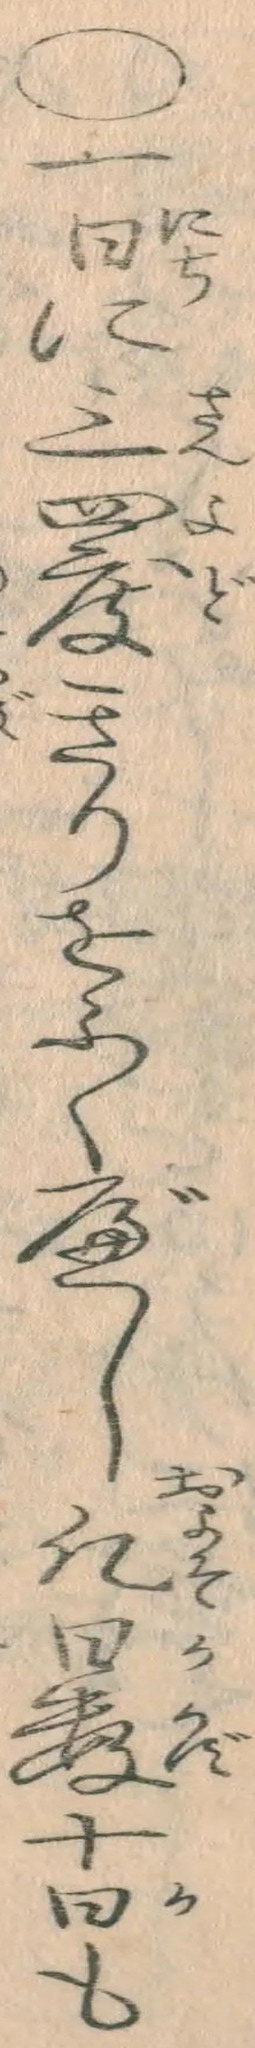○一日に三四度きりをふくべし凡日数十日も
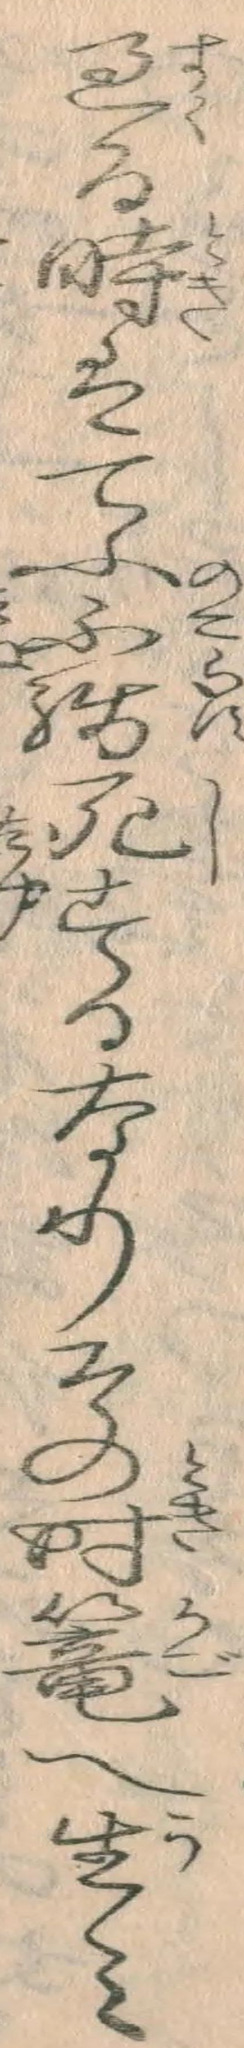過る時はてふ不残死するなりその時篭へ生み
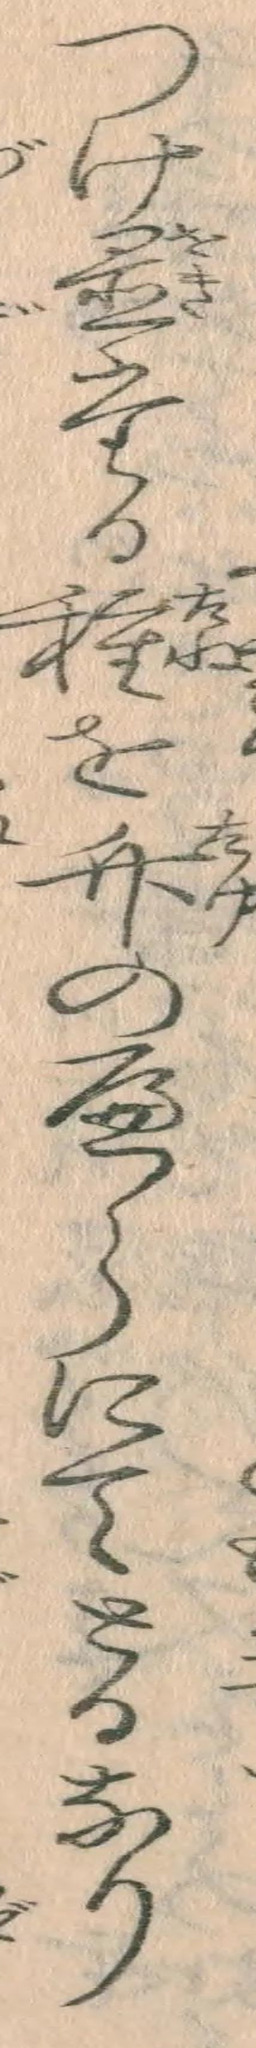つけ置たる種を竹のへらにてとるなり
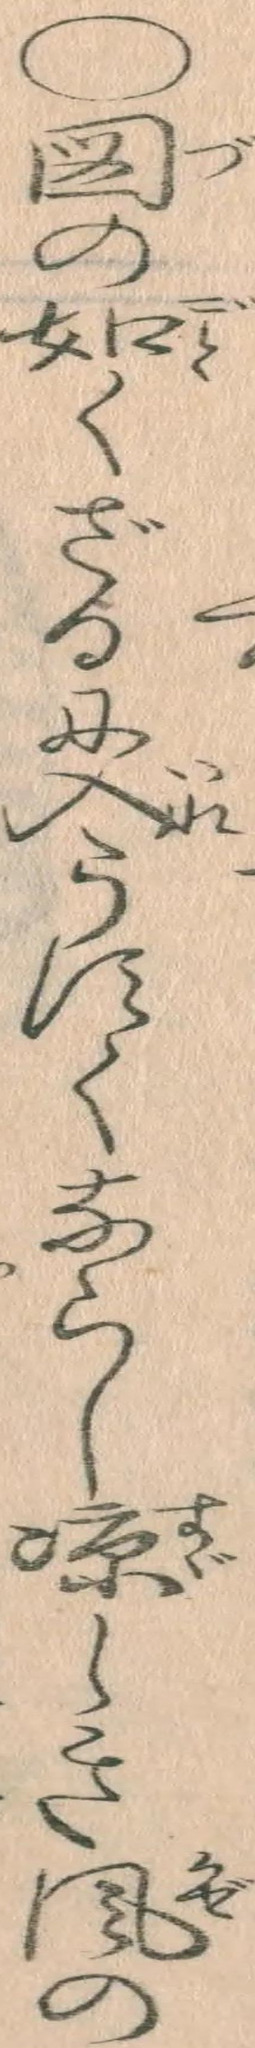○図の如くざるに入うすくならし涼しき風の
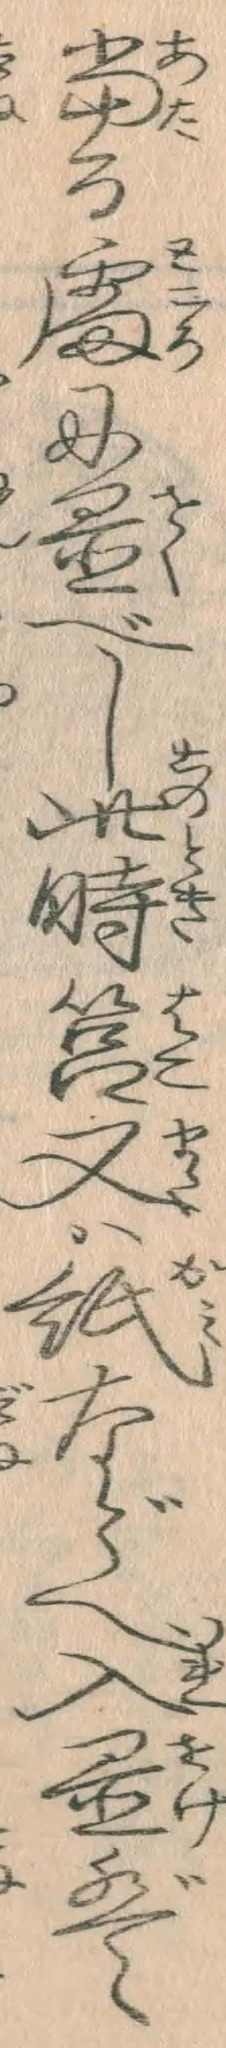当る処に置べし此時筥又は紙などへ入置ば
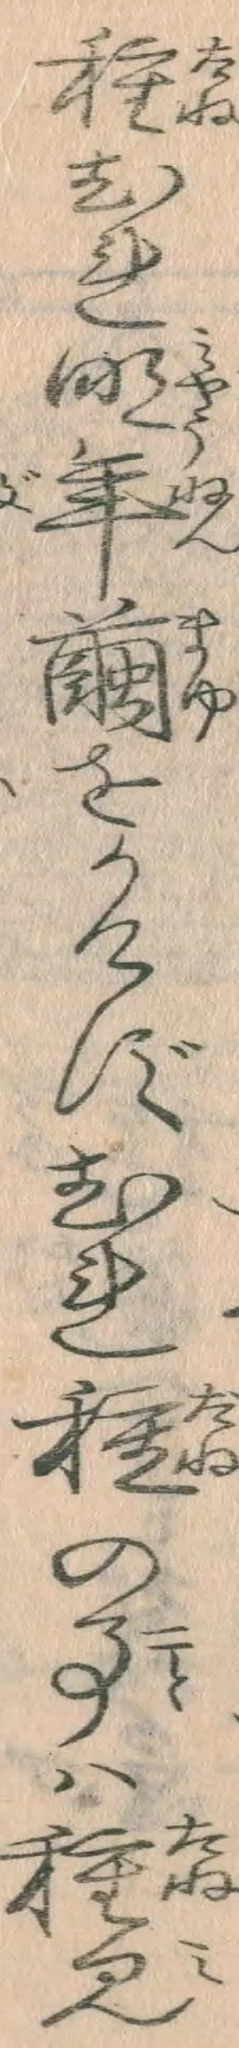種むれ明年繭をかけずむれ種の事は種見
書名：山繭養法秘傳抄
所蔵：国立国会図書館 National Diet Library, JAPAN
